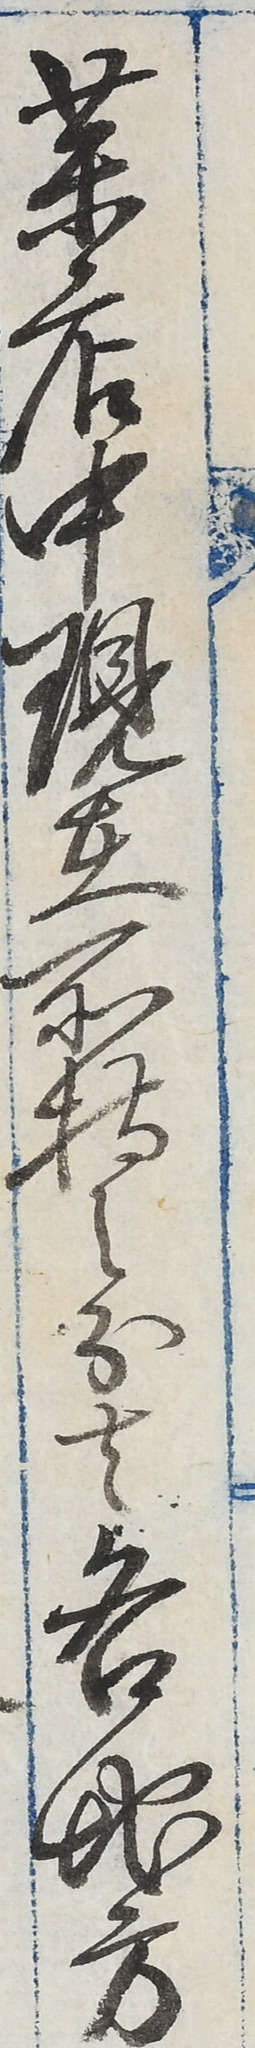一薬店中現在所持之分者各地方
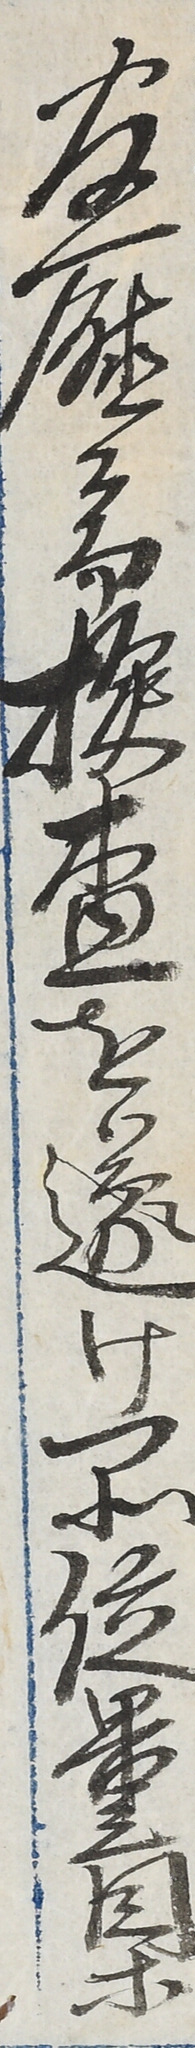官庁ニ而検査を遂け品位量目等
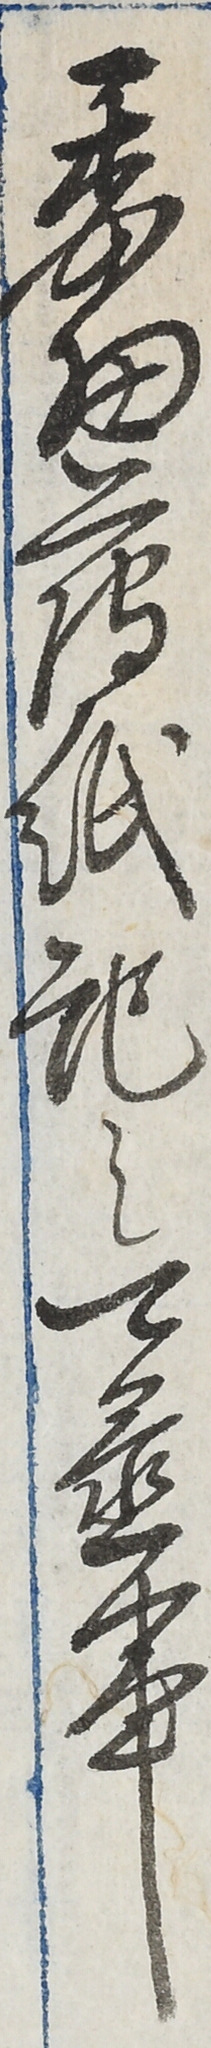委細薄紙記シ可置事
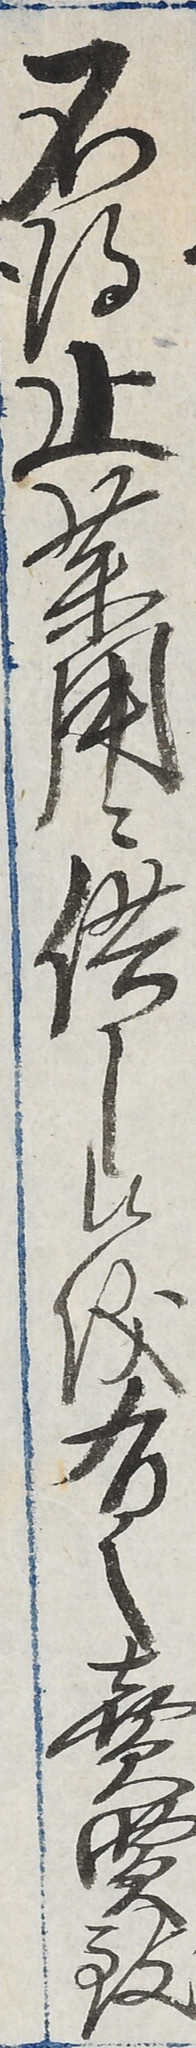一不得止薬用ニ供し候儀有之売買致
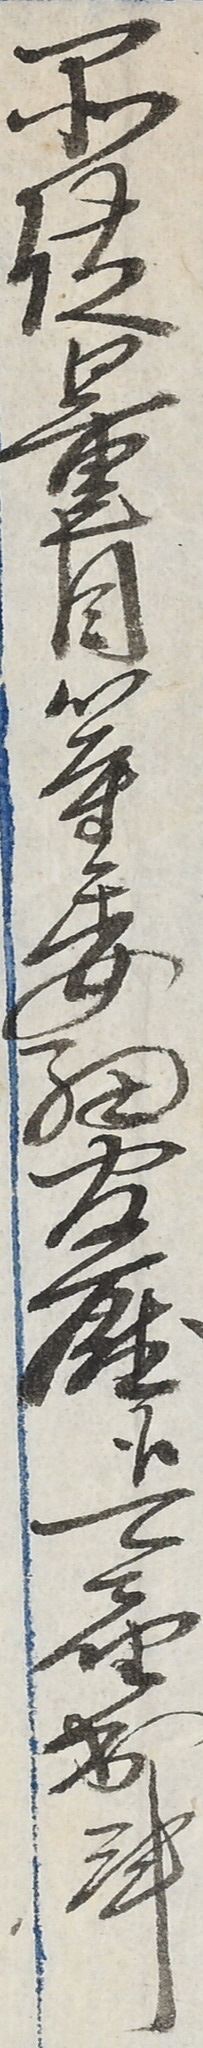品位量目等委細官庁江可届出事
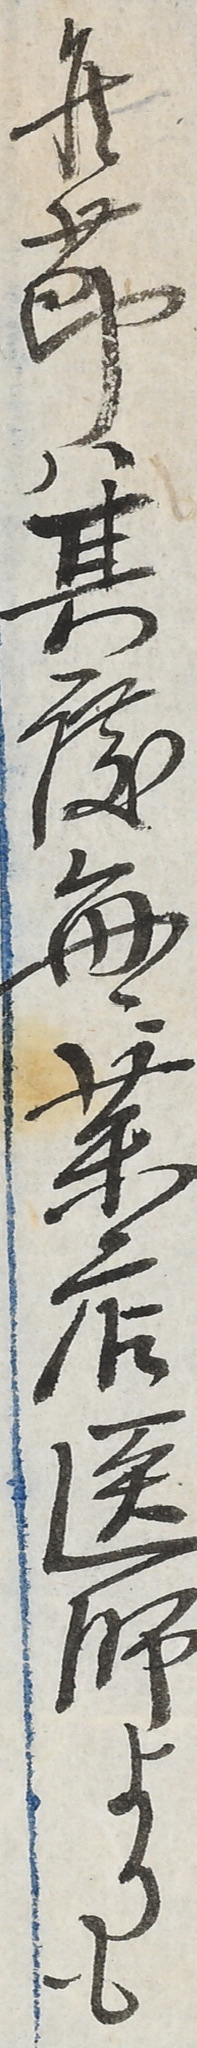候節ハ其度毎ニ薬店医師よりも
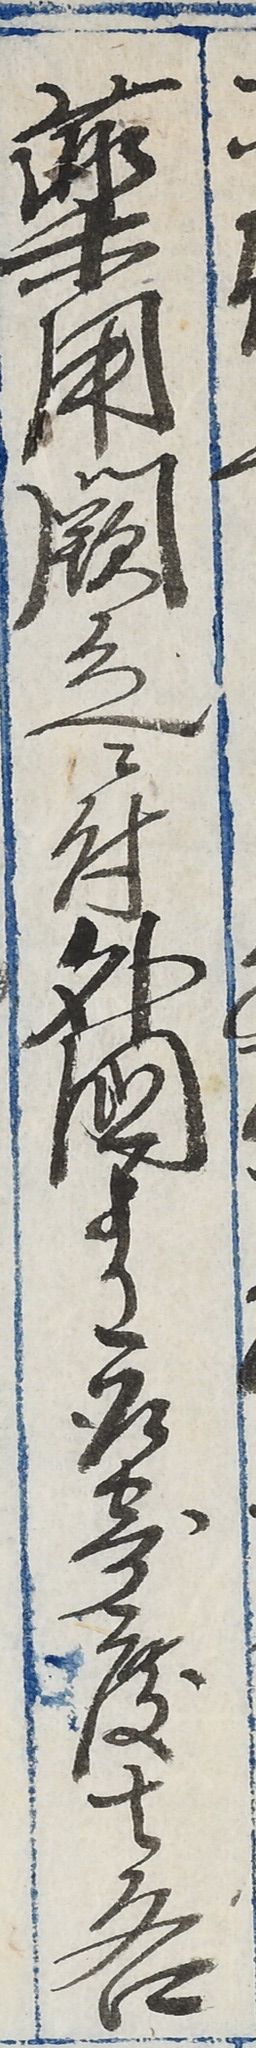一薬用闕立ニ付外国より取寄度者各
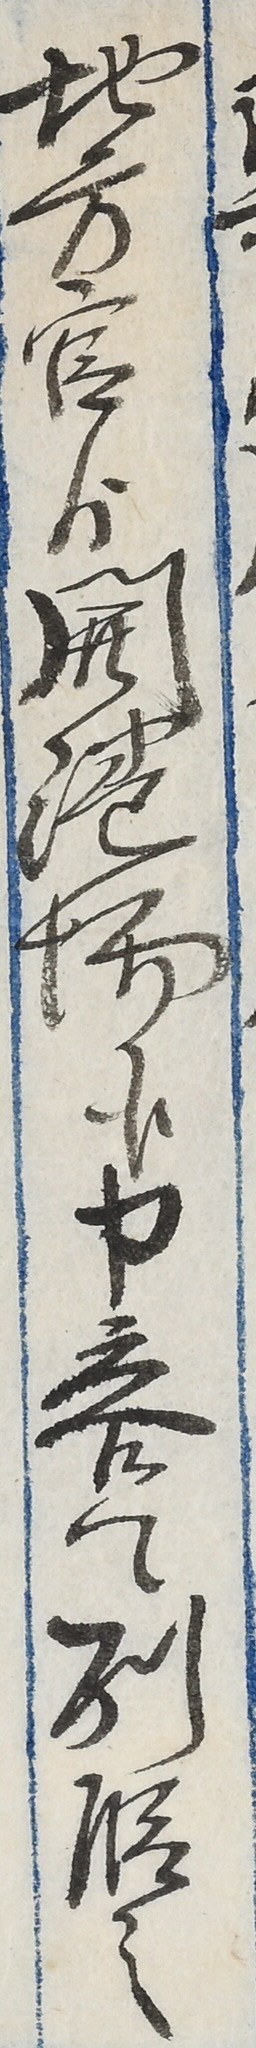地方官ゟ開港場江申立候ハゝ別段之
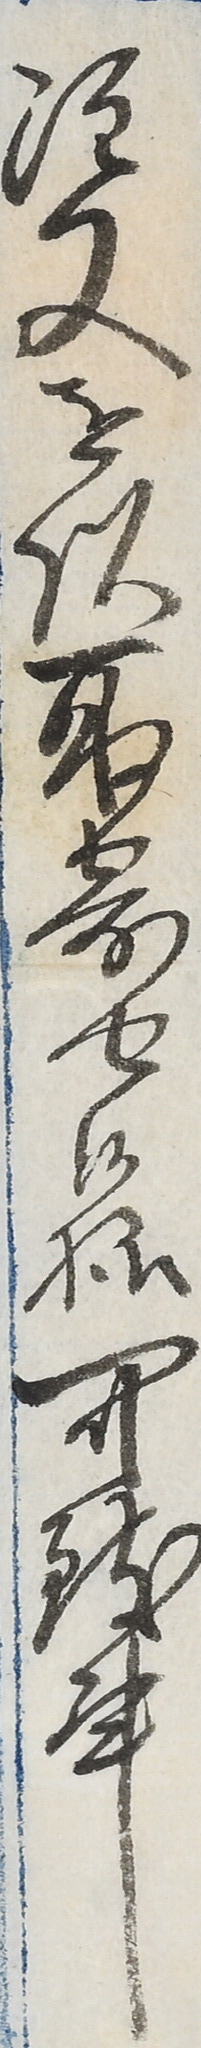注文を以取寄セ候様可致事
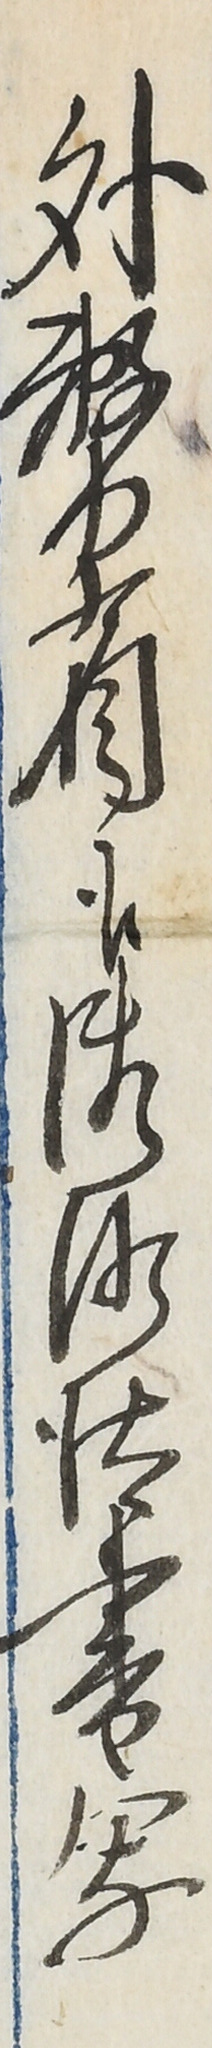外務省江御沙汰書写
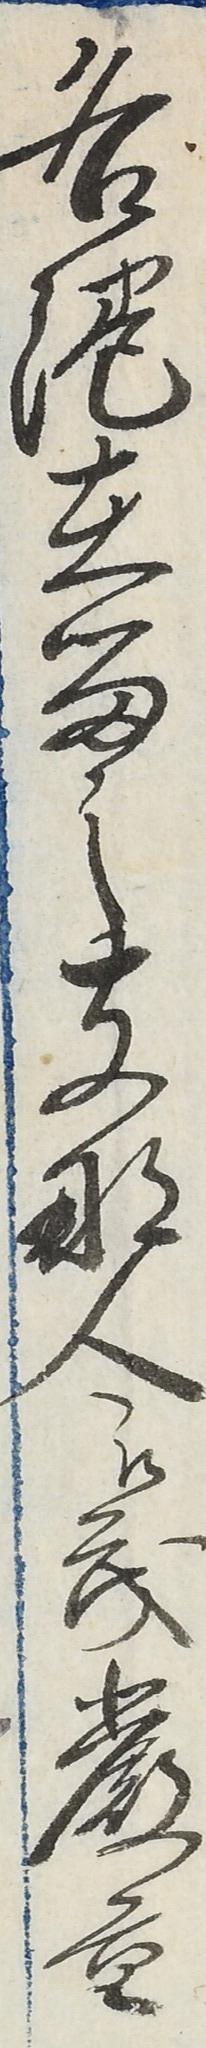各港在留之支那人江茂厳重
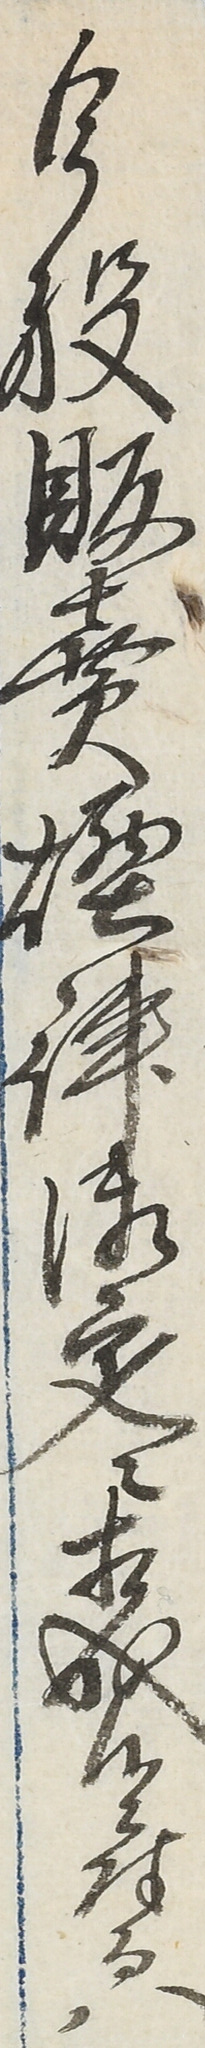今般販売煙律御定ニ相成候ニ付而ハ
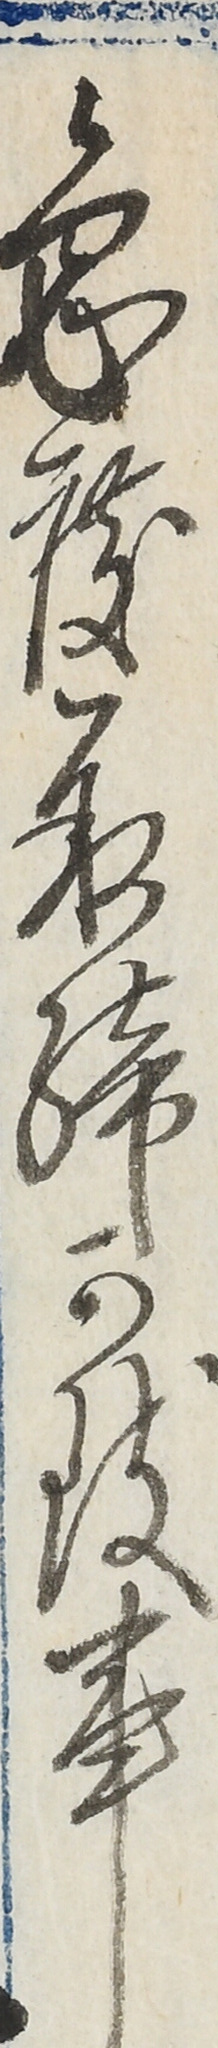急度取締可致事
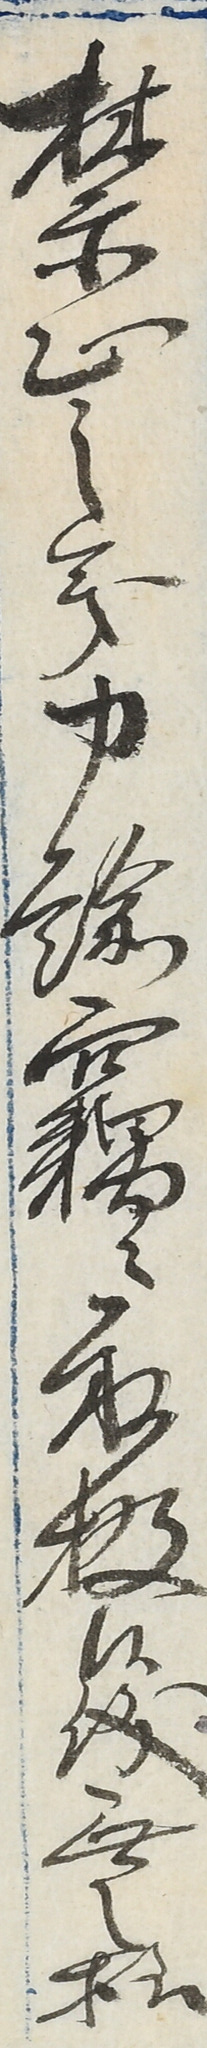禁止之義申諭竊ニ取扱候儀無之様
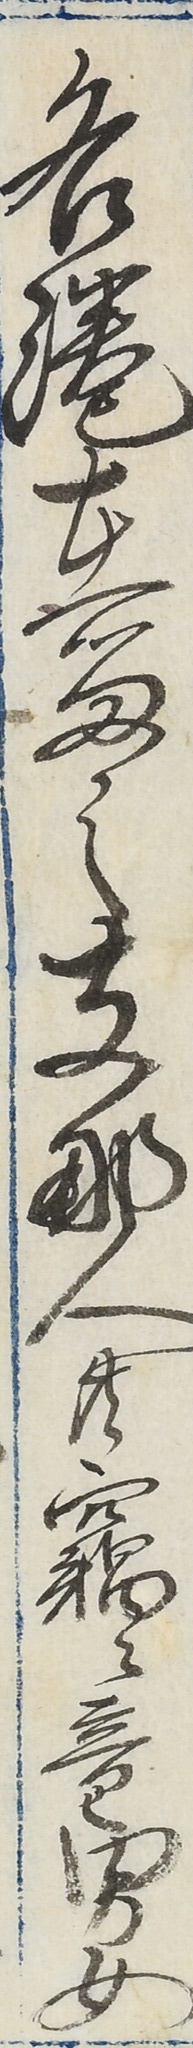一各港在留之支那人共竊ニ童男女
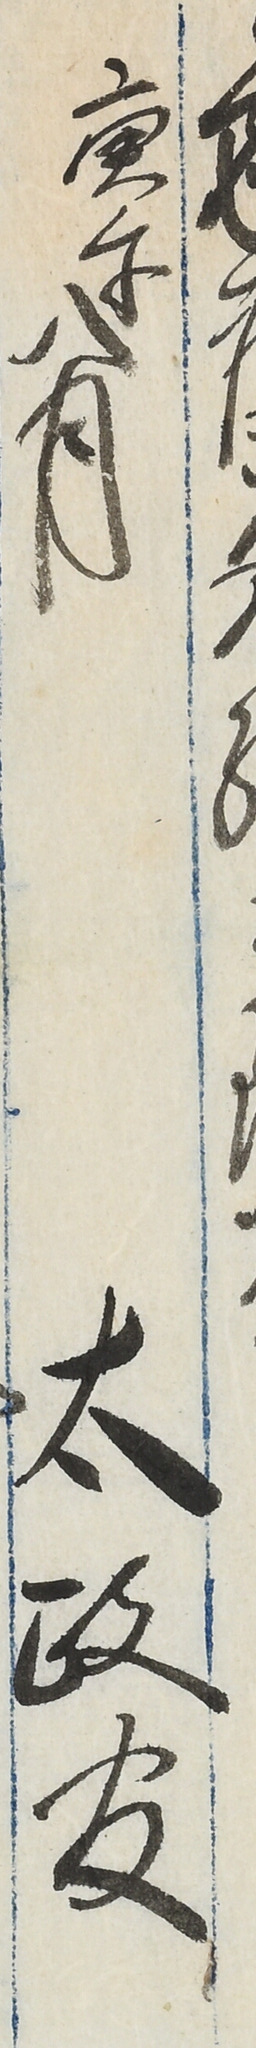庚午八月太政官
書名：布達書留
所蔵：伊那市立高遠町図書館・合同会社AMANE
